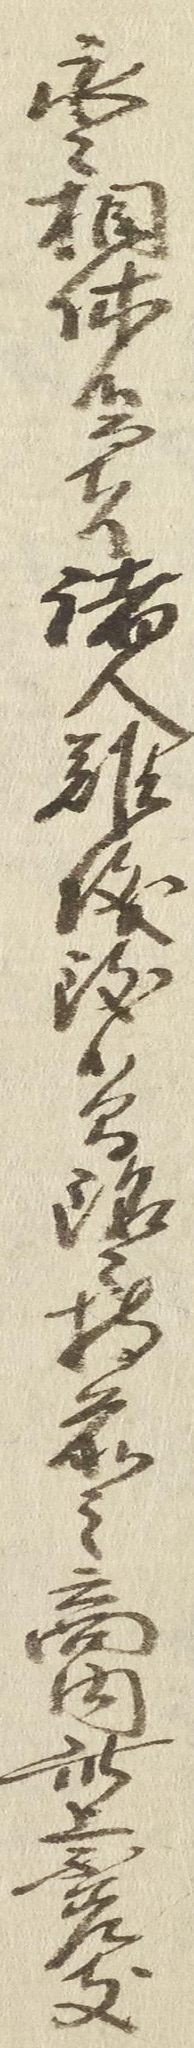永々相休候而は諸人難儀致候間銘々持前之商内此上不差支
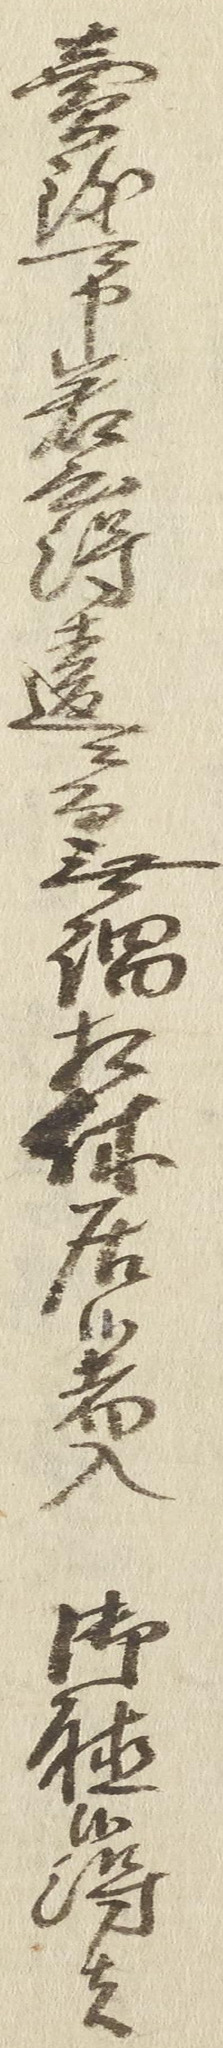売致可申若心得違二而無偶相休居候者入御聴候得は
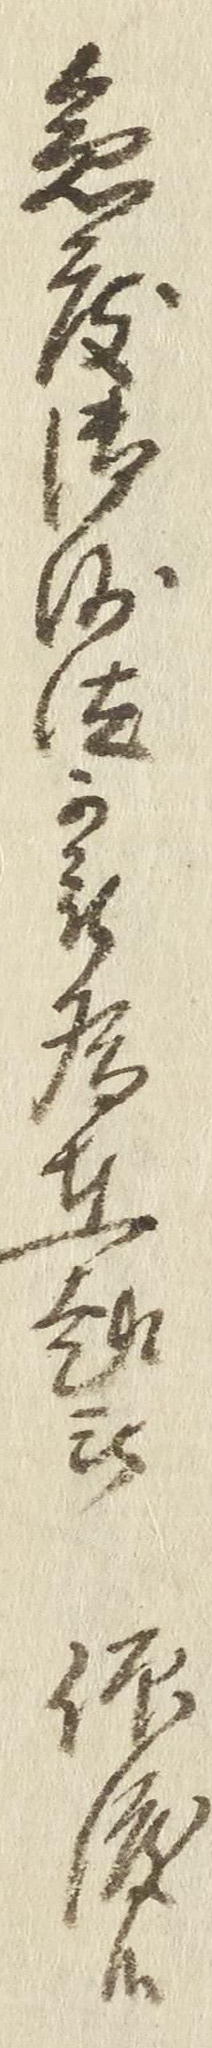急度御沙汰可被為在趣被仰渡候
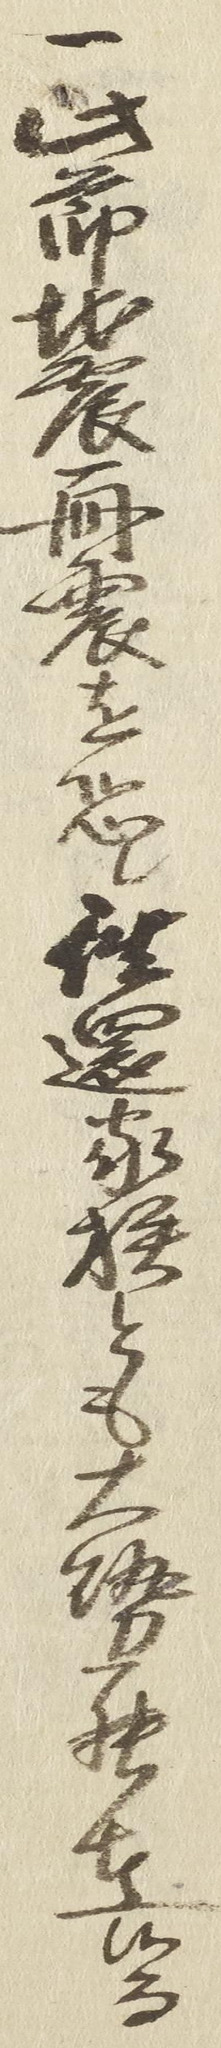一此節地震再震を恐往還家族とも大勢罷在候而
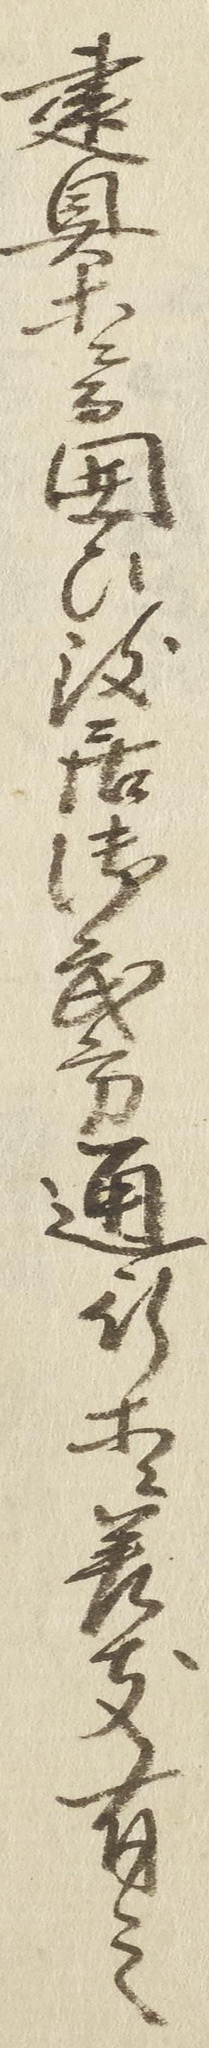建具等二而囲ひ致居御武方通行等に差支有之
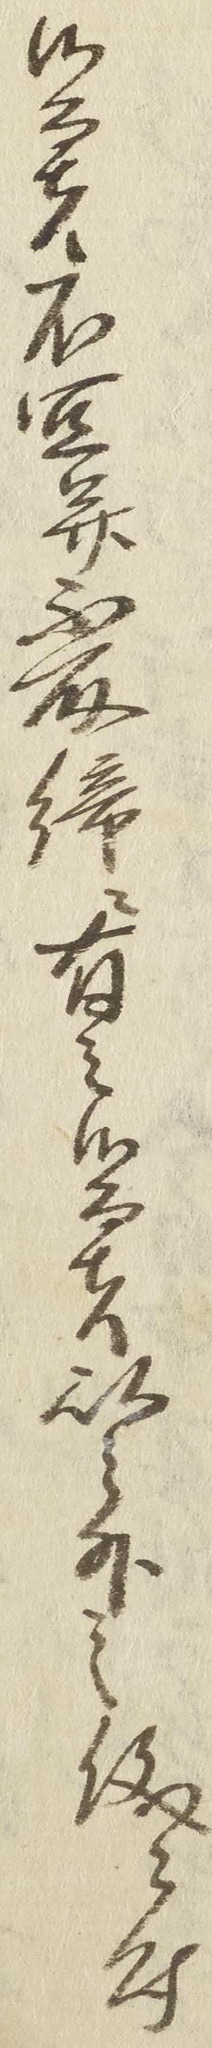候而は不宜并不取締に有之候而は以之外之儀二付
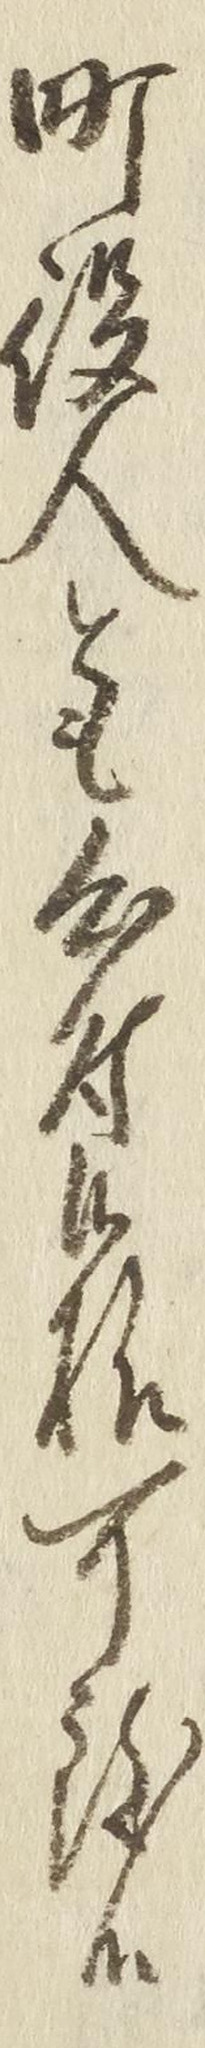町役人とも心付候様可致候
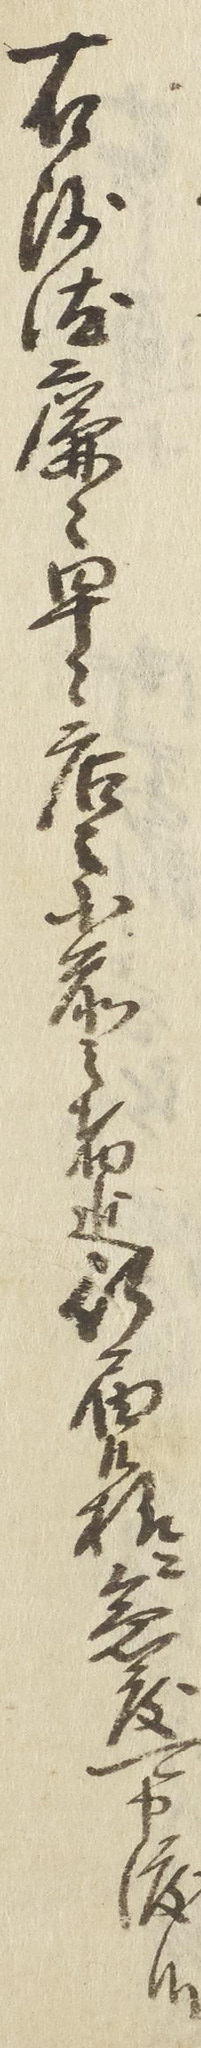右沙汰廉々早々店々小前之者迄行届候様二急度可申渡候

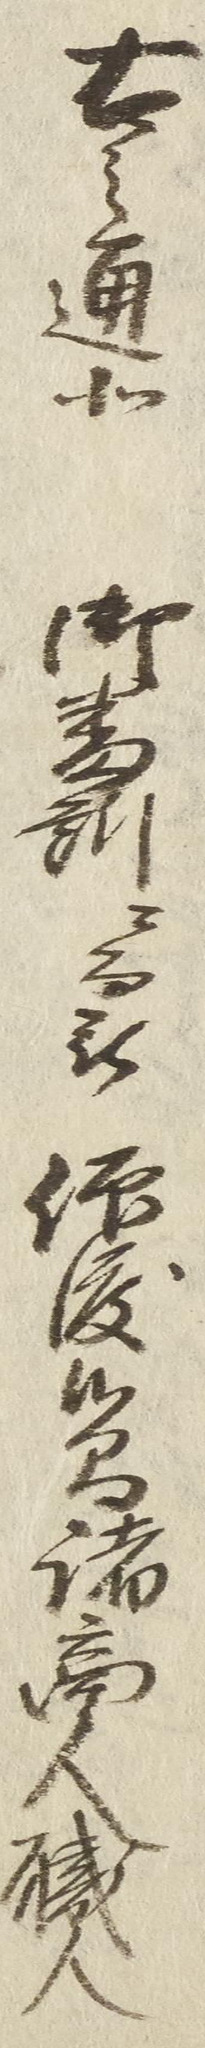右之通北御番所二而被仰渡候間諸商人職人
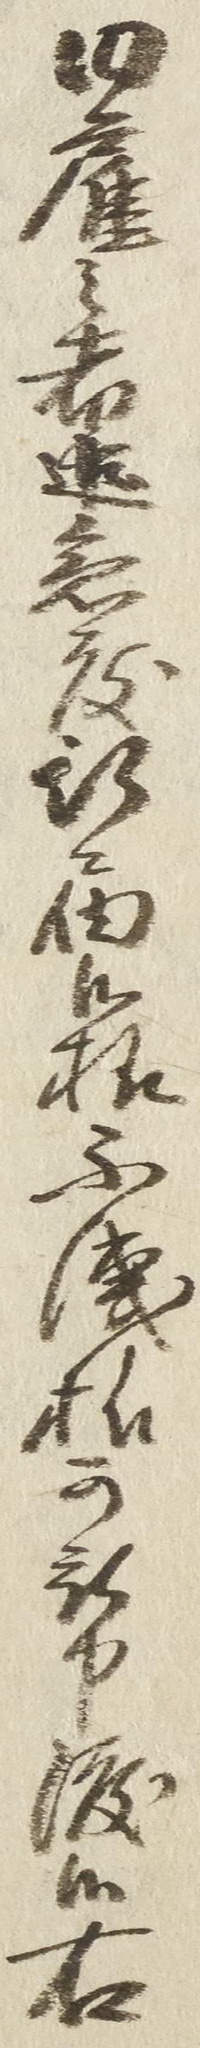内雇之者迄急度行届候様不漏様可被申渡候右
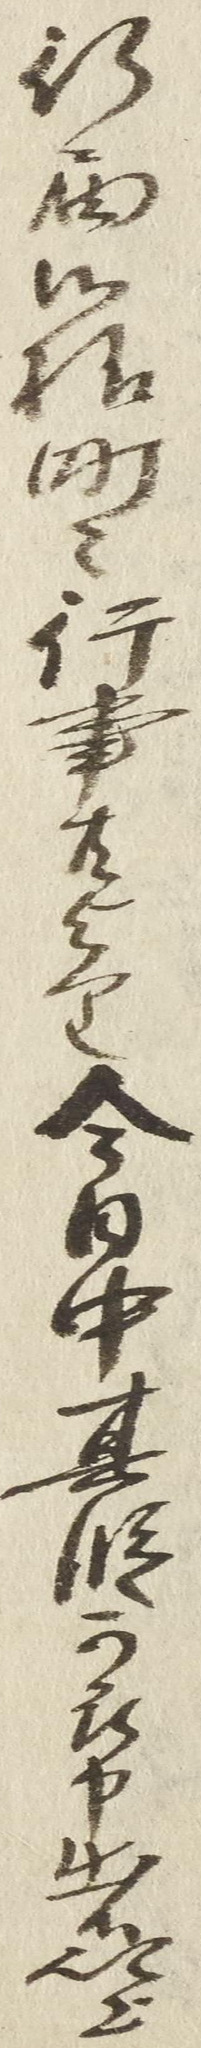行届候様町々行事共より今日中其段可被申出候以上
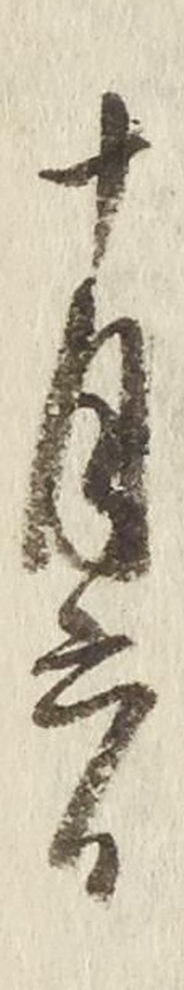十月六日
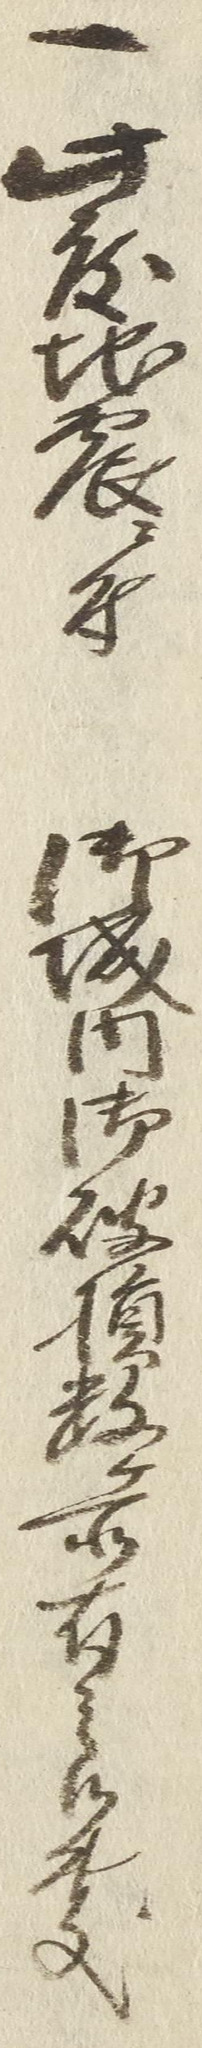一此度地震二付御城内御破損数ヶ所有之候処
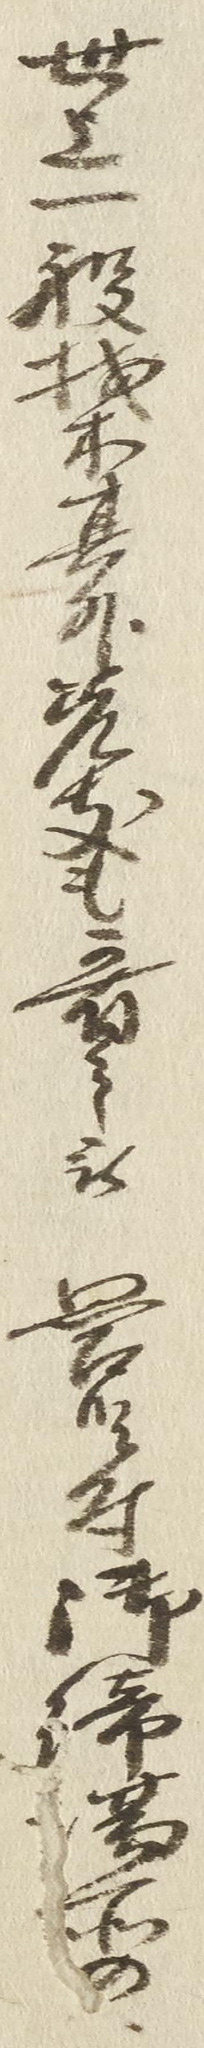世上一般材木其外差支も有之被思召候二付御締場所の
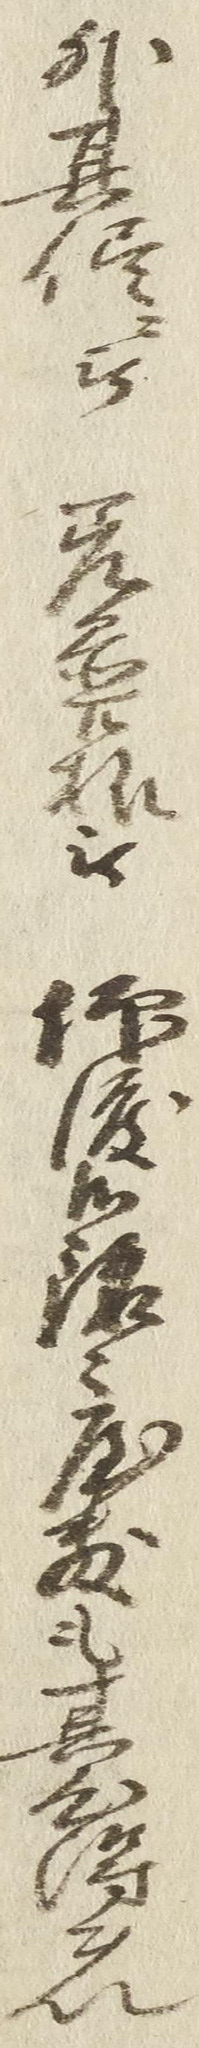外其儘二被差置候様被仰渡候銘々屋敷も其心得ヲ以
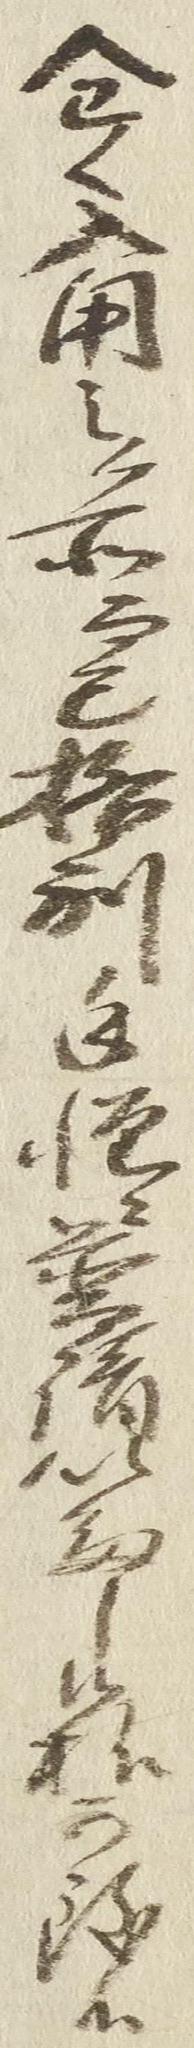全く入用之ヶ所吞而巳格別手軽に普請いたし候様可致候
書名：従往古地震御届書記誌之一
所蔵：東京大学地震研究所図書室 Earthquake Research Institute Library, The University of Tokyo, JAPAN
